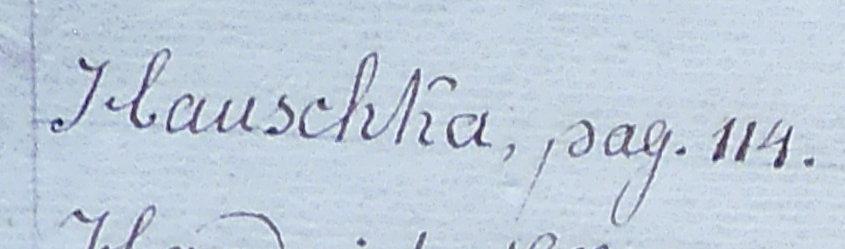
Hauschka, pag 114.
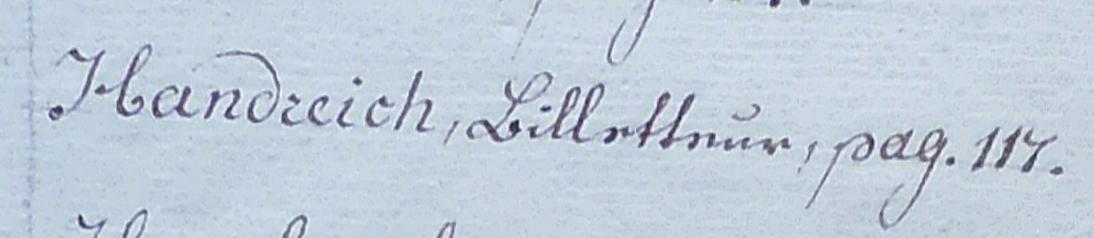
Handreich, Billetteur, pag. 117.
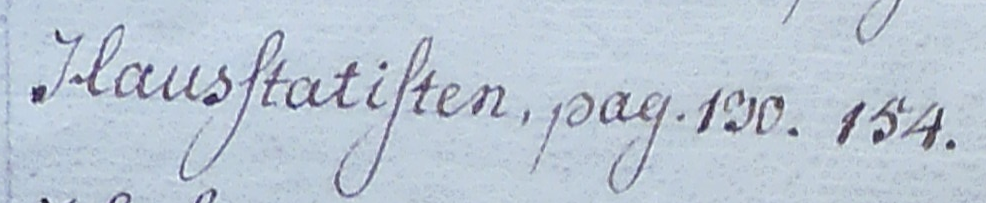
Hausstatisten, pag. 130. 154.
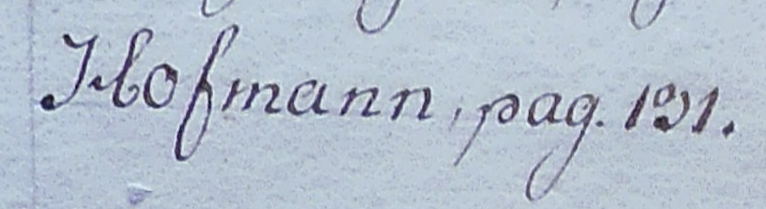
Hofmann, pag. 131.
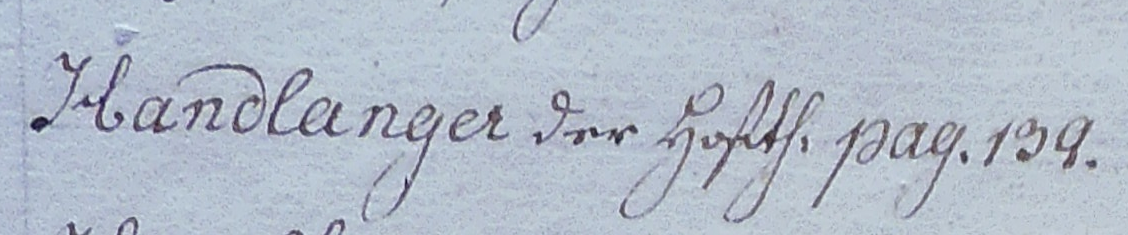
Handlanger der Hofth: pag. 139.
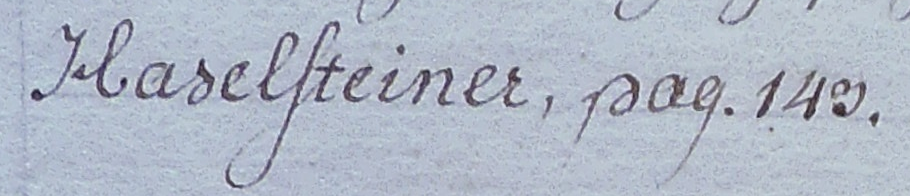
Haselsteiner, pag. 143.
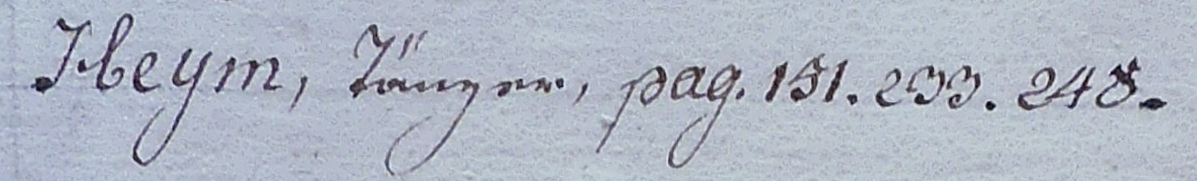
Heym, Tänzer, pag. 151. 233. 248.
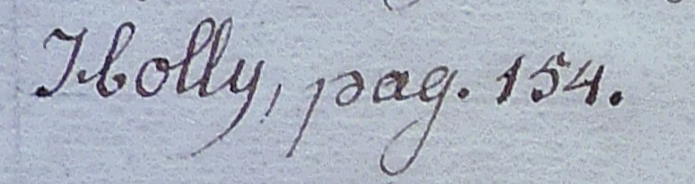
Holly, pag. 154.
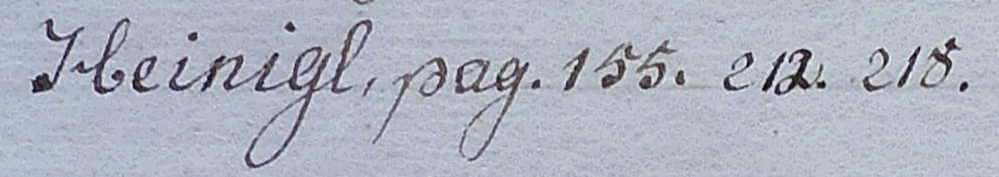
Heinigl, pag. 155. 212. 218.
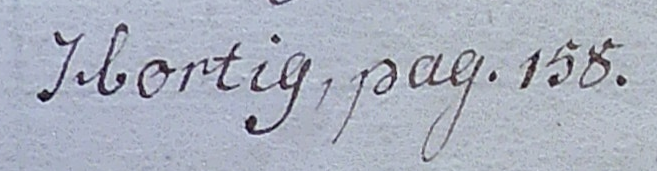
Hortig, pag. 158.
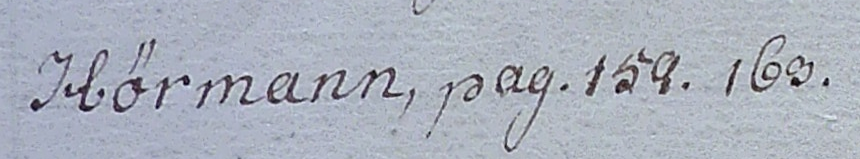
Hörmann, pag. 159. 163.
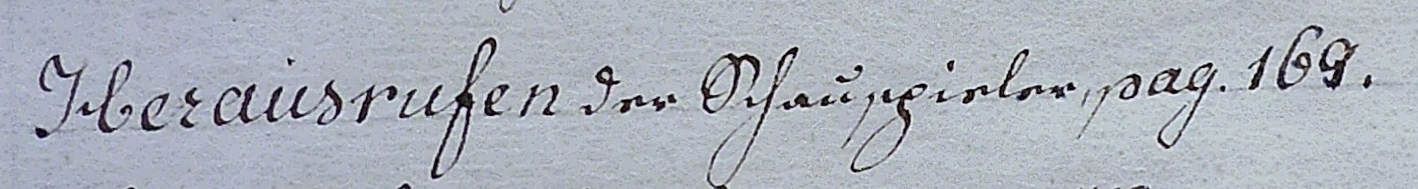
Herausrufen der Schauspieler, pag. 169.
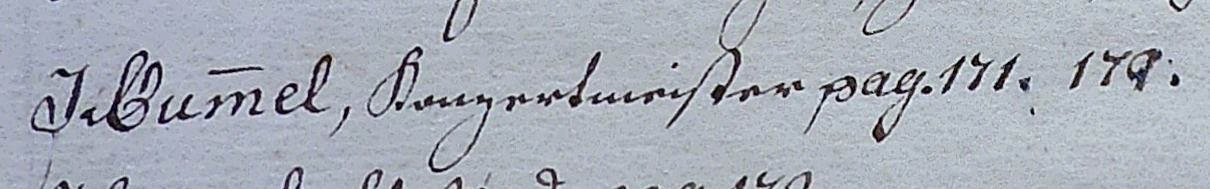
Hum̅el, Konzertmeister pag. 171. 179.
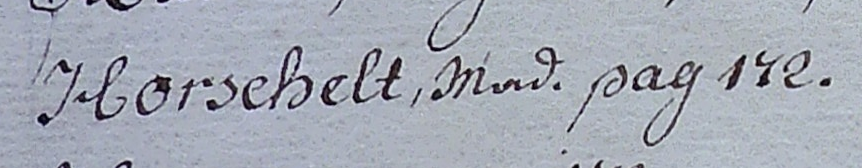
Horschelt, Mad. pag 172.
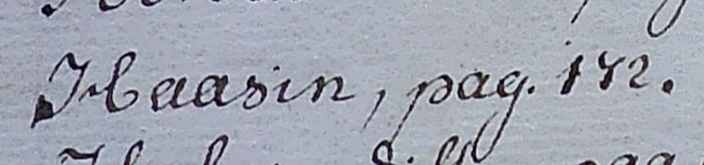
Haasin, pag. 172.
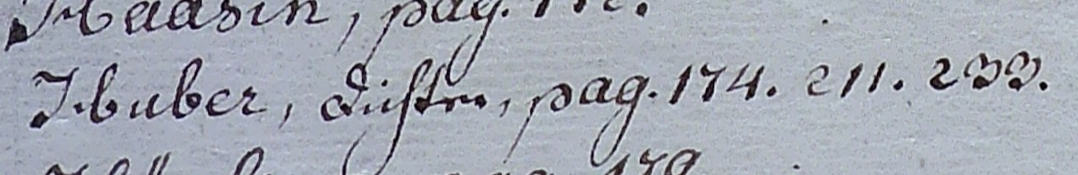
Huber, Dichter, pag. 174. 211. 233.
